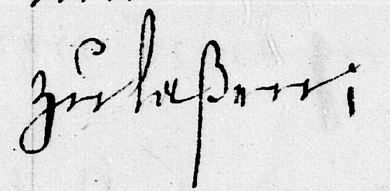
zu laßen;
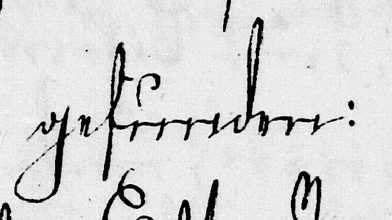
gefunden:
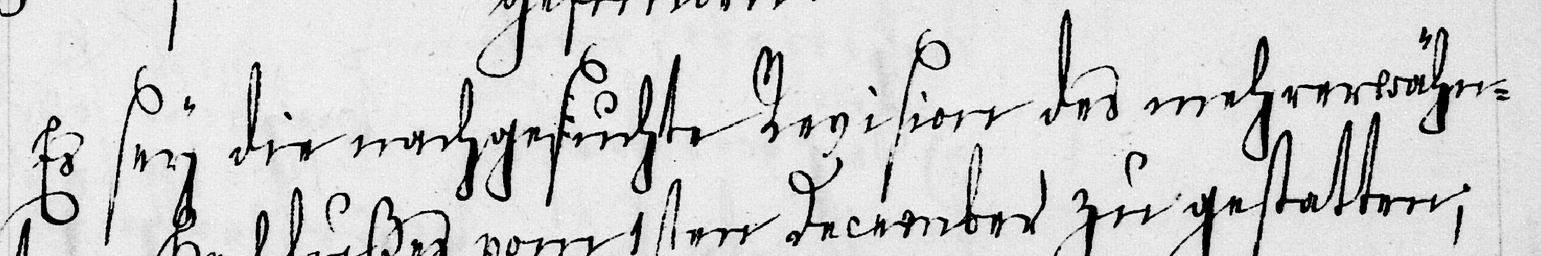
Es sey die nachgesuchte Revision des mehrerwähn¬
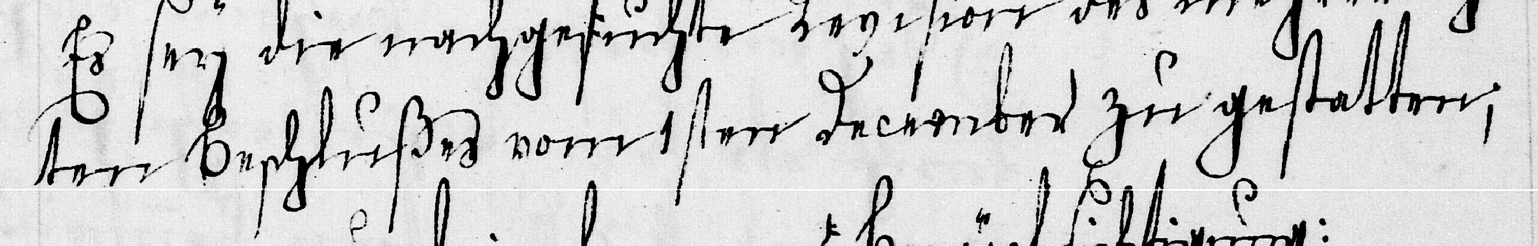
ten Beschlußes vom 1sten December zu gestatten;
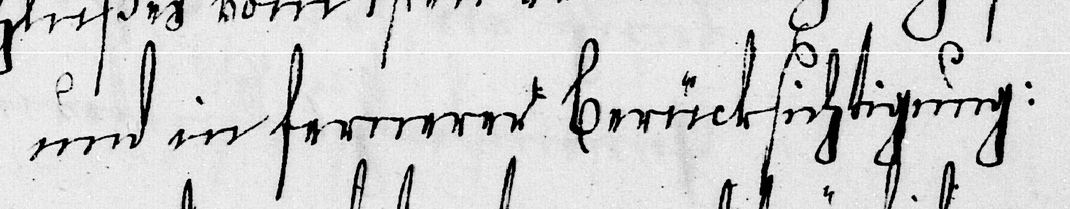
und in fernerer Berücksichtigung:
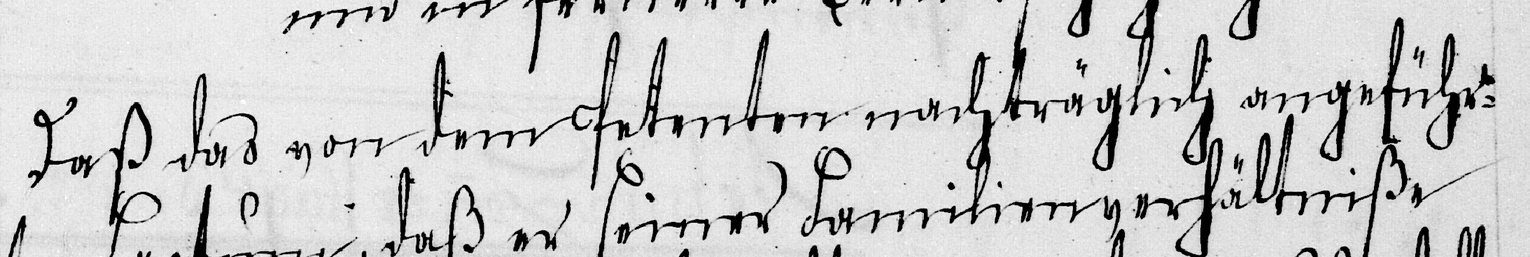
Daß das von dem Petenten nachträglich angeführ¬
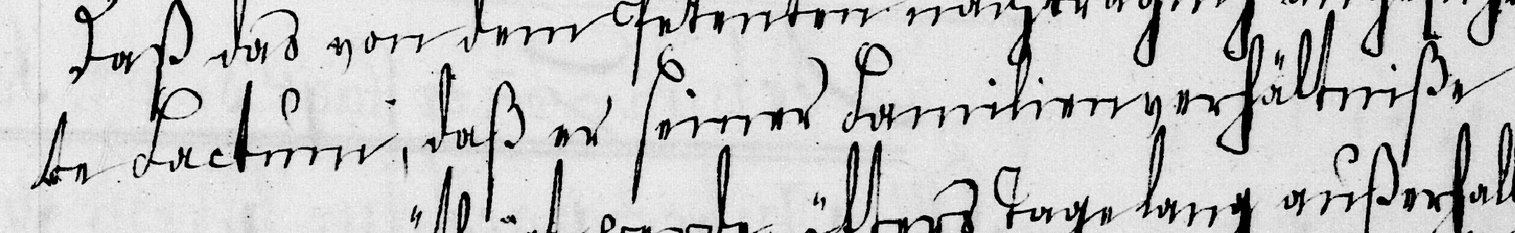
te Factum, daß er seiner Familienverhältniße
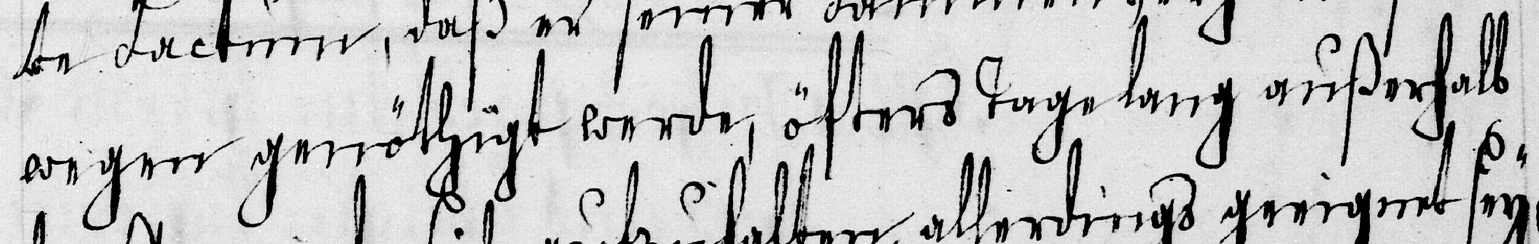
wegen genöthigt werde , öfters Tage lang außerhalb
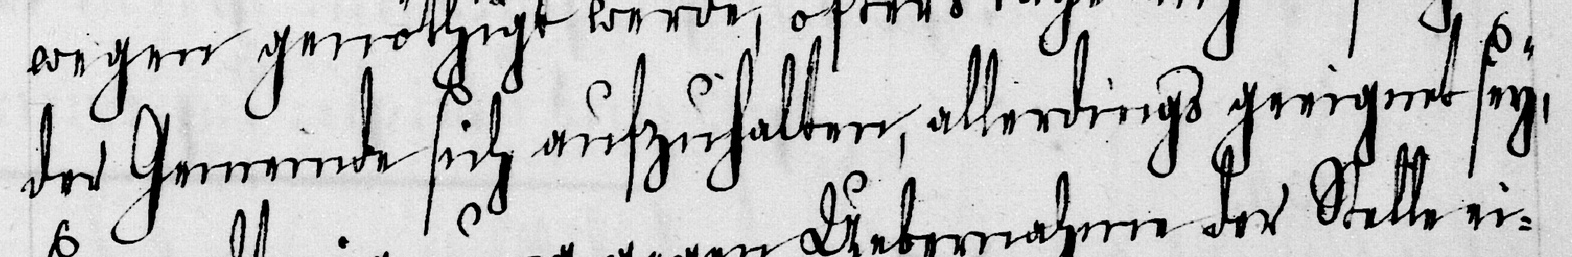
der Gemeinde sich aufzuhalten, allerdings geeignet sey,
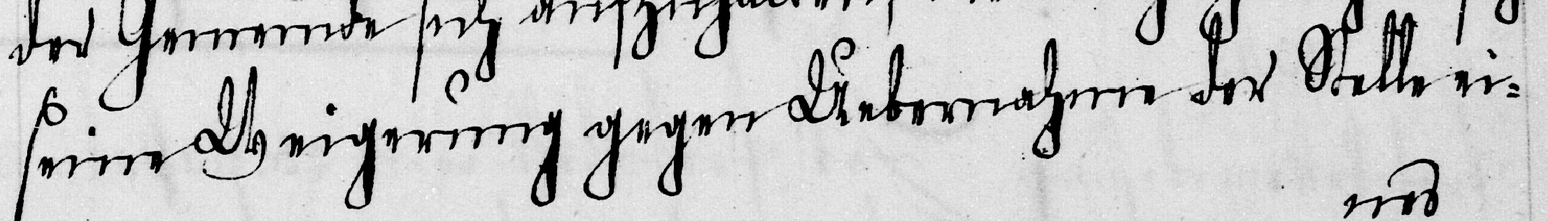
seine Weigerung gegen Uebernahme der Stelle ei-
